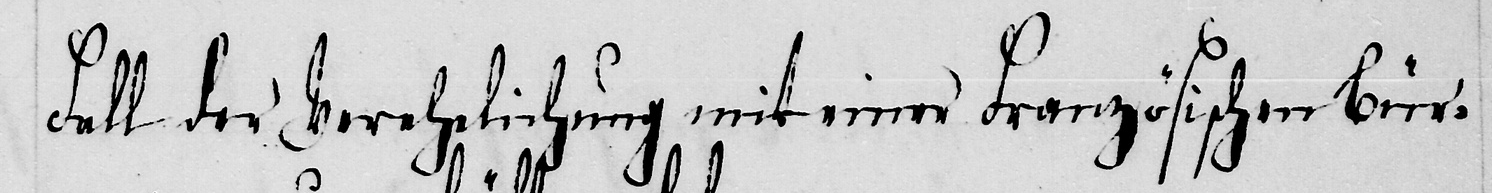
Fall der Verehelichung mit einer Französischen Bür¬
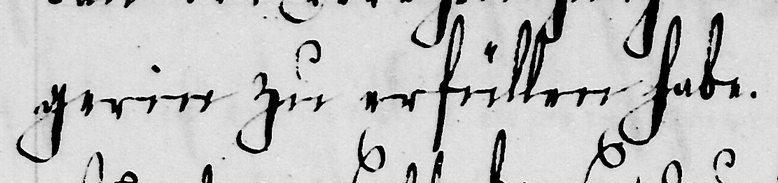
gerin zu erfüllen habe.
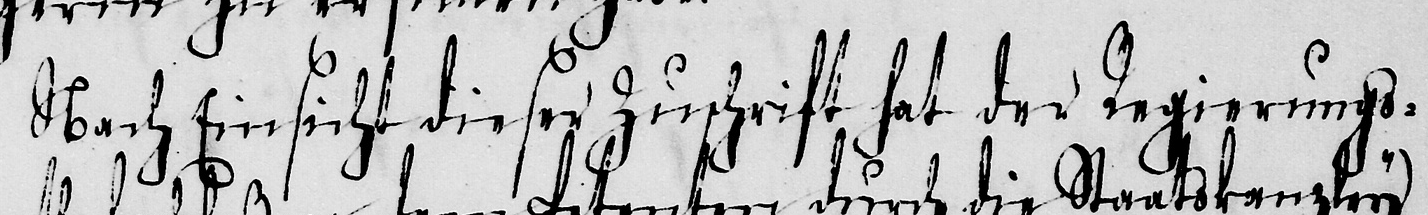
Nach Einsicht dieser Zuschrift hat der Regierungs¬
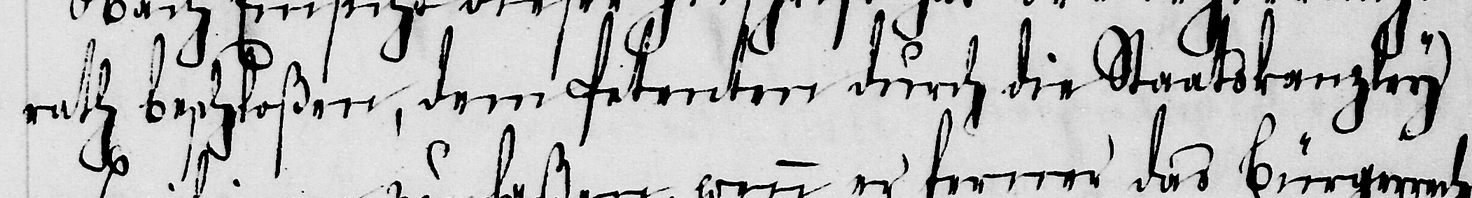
rath beschloßen, dem Petenten durch die Staatskanzley
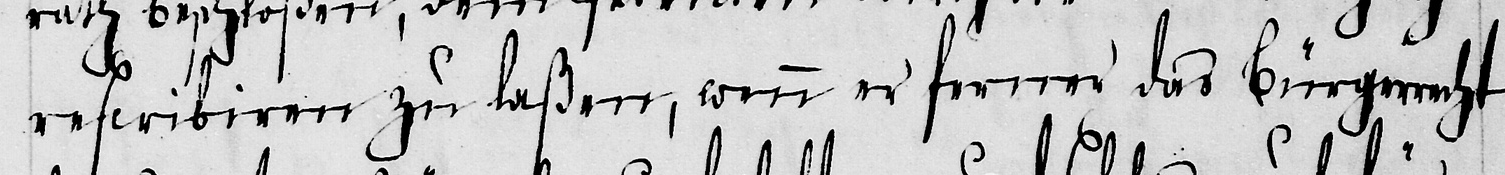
rescribiren zu laßen, wenn er ferner das Bürgerrecht
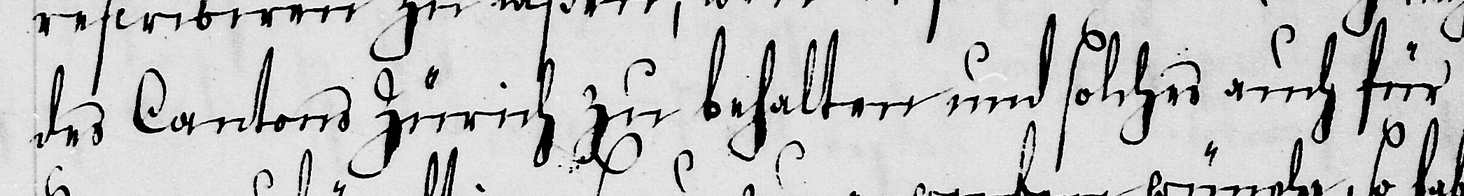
des Cantons Zürich zu behalten und solches auch für
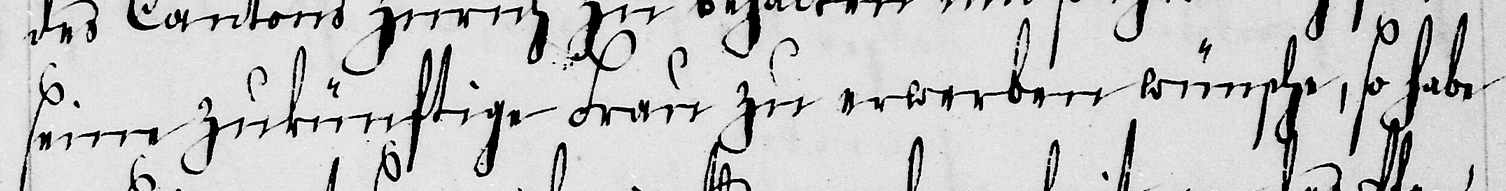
seine zukünftige Frau zu erwerben wünsche, so habe
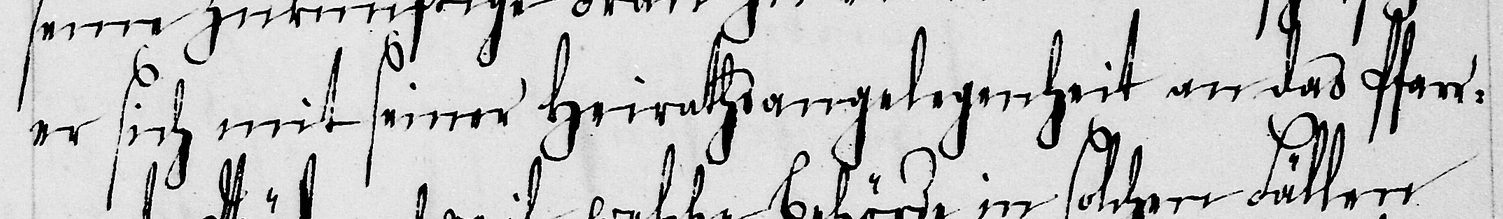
er sich mit seiner Heirathsangelegenheit an das Pfarr¬
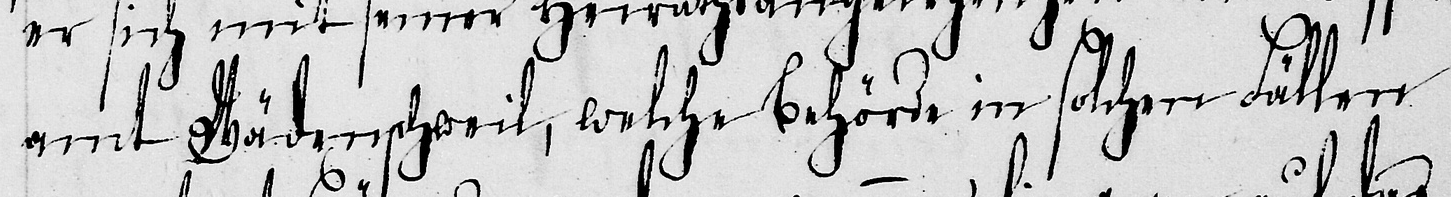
amt Wädenschweil, welche Behörde in solchen Fällen
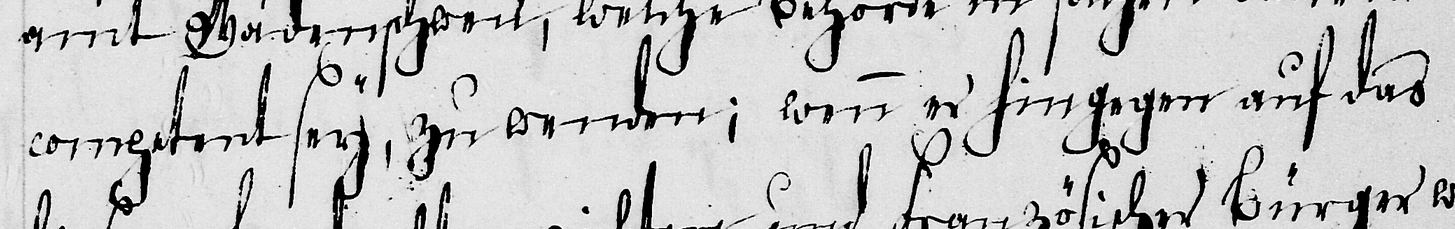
competent sey, zu wenden; wenn er hingegen auf das
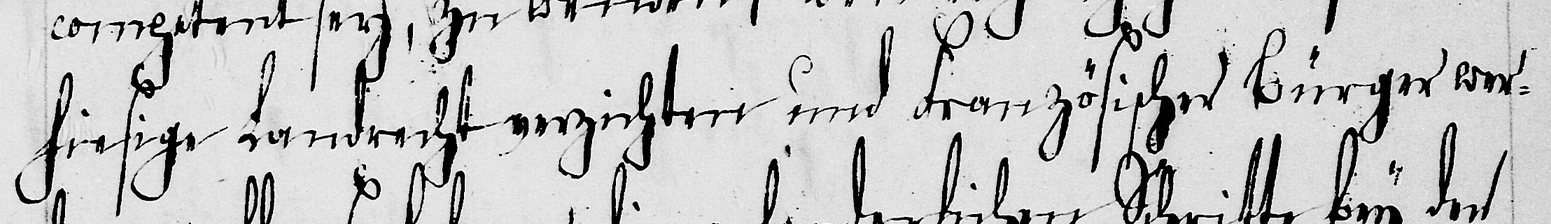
hiesige Landrecht verzichten und Französischer Bürger werd¬
